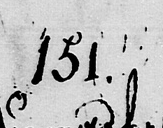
11.
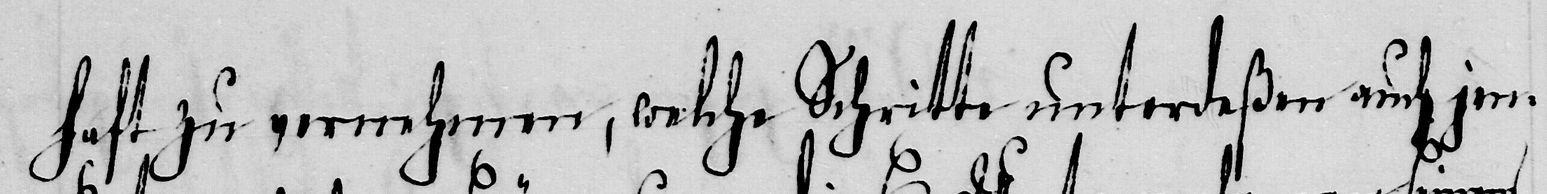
haft zu vernehmen, welche Schritte unterdeßen auch jen¬
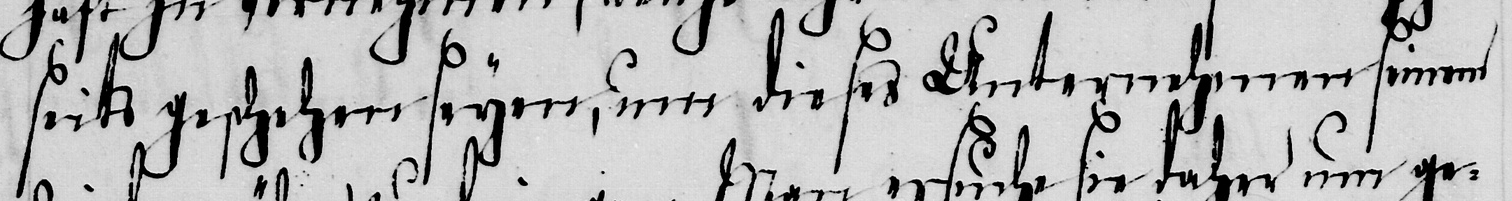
seits geschehen seyen, um dieses Unternehmen seinem
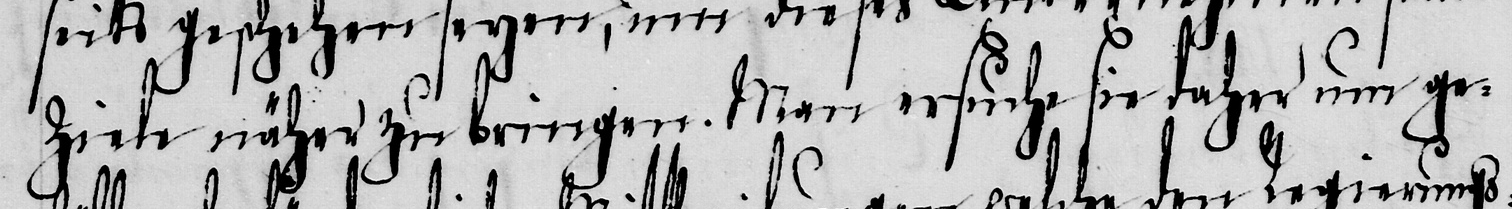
Ziele näher zu bringen. Man ersuche sich daher um ge¬
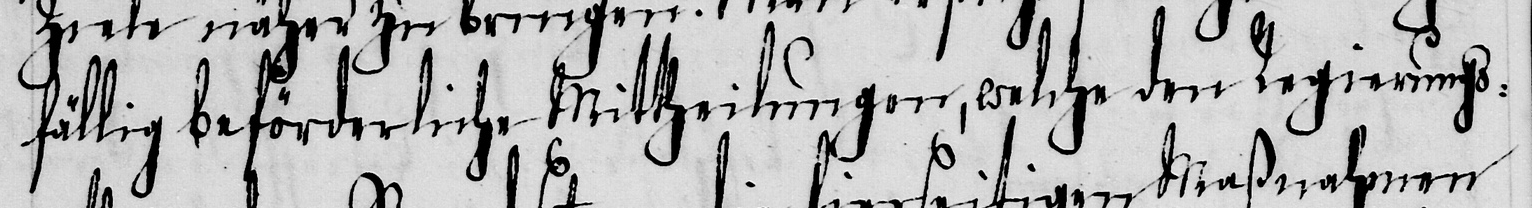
fällig beförderliche Mittheilungen, welche den Regierungs¬
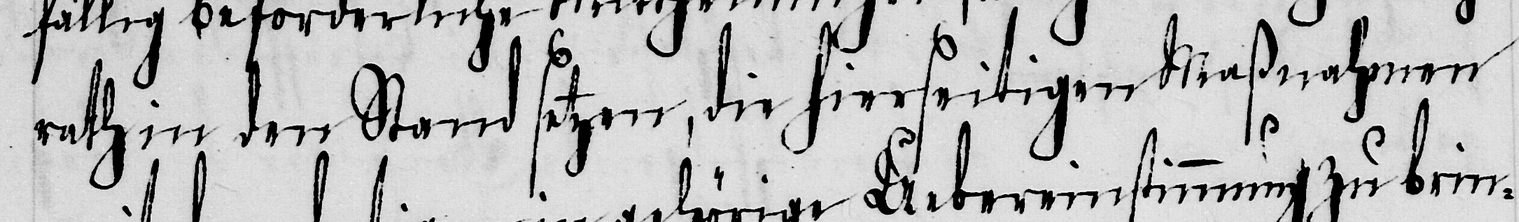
rath in den Stand setzen, die hierseitigen Maßnahmen
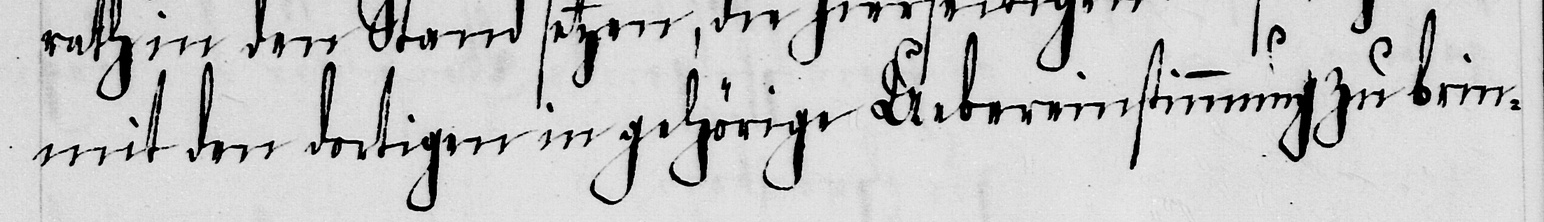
mit den dortigen in gehörige Uebereinstimmung zu brin¬
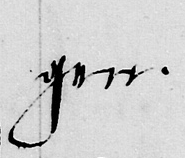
gen.
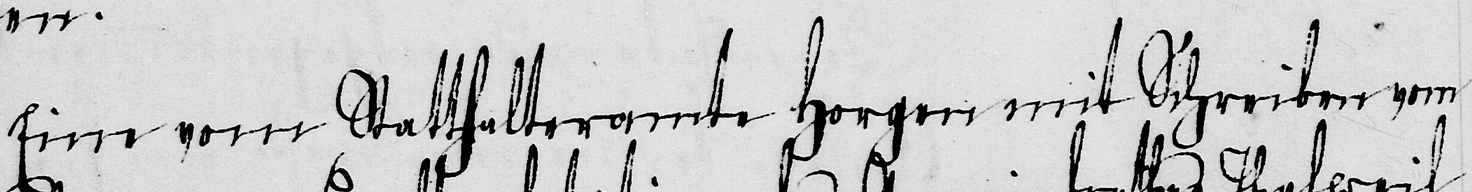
Eine vom Statthalteramte Horgen mit Schreiben vom
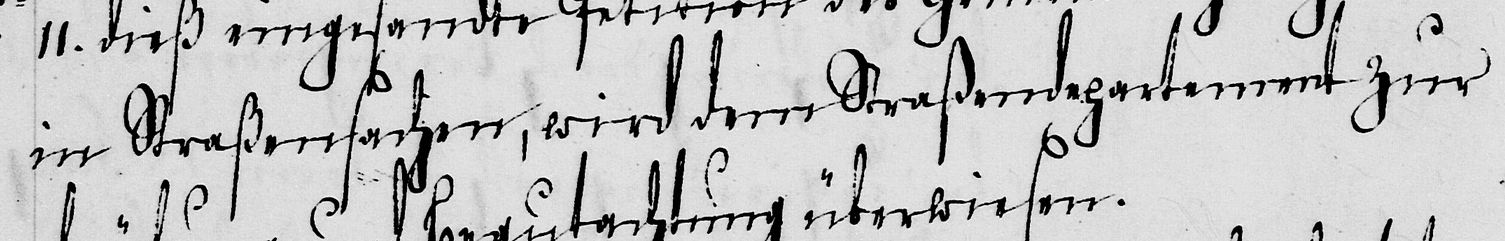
in Straßensachen, wird dem Straßendepartement zur
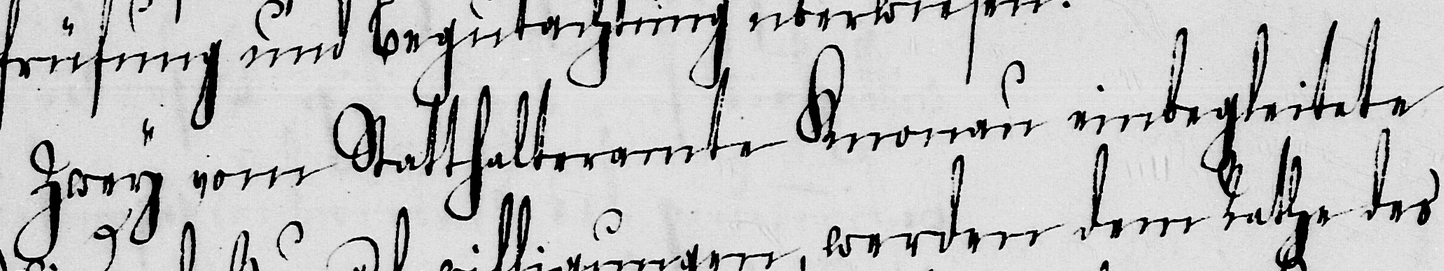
Zwey vom Statthalteramte Knonau einbegleitete
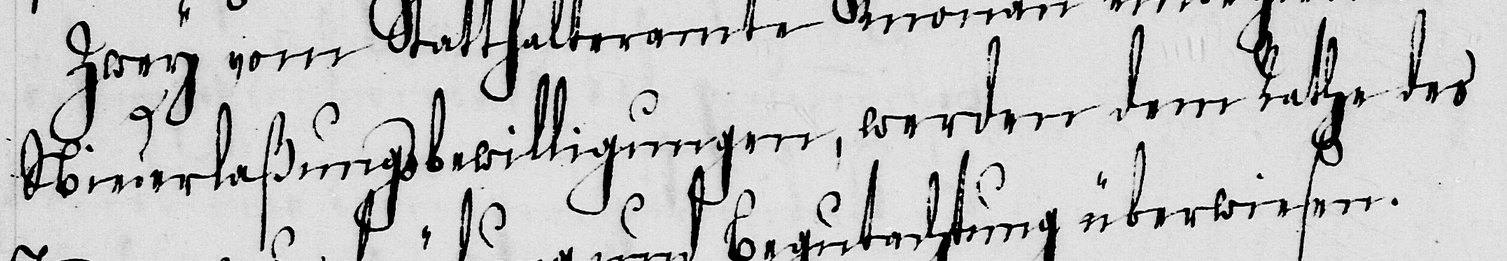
Niederlaßungsbewilligungen, werden dem Rathe des
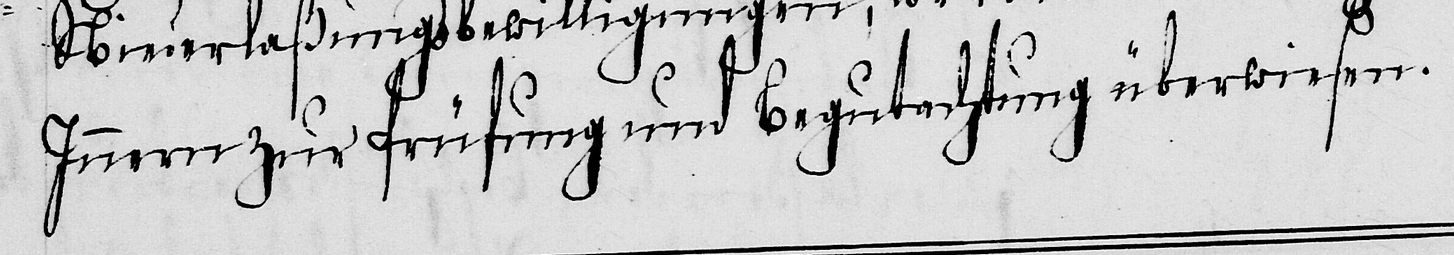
Innern zur Prüfung und Begutachtung überwiesen.
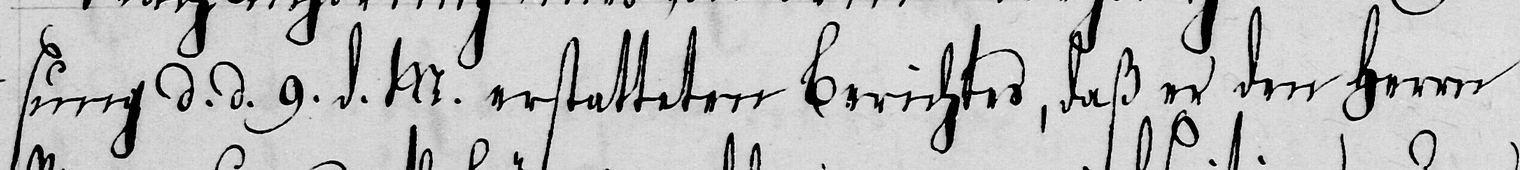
sung d. d. 9. d. M. erstatteten Berichtes, daß er den Herrn
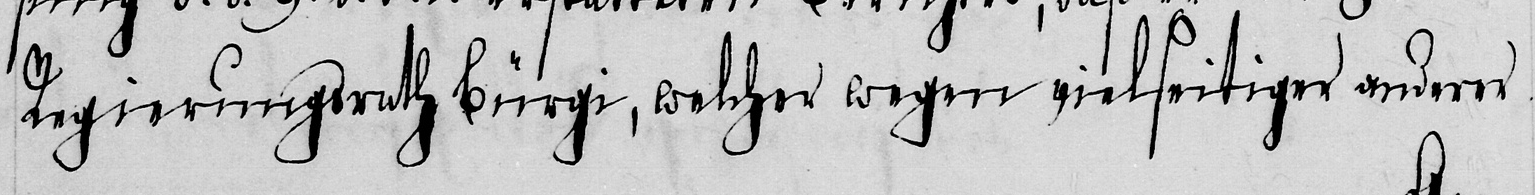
Regierungsrath Bürgi, welcher wegen vielseitiger anderer
